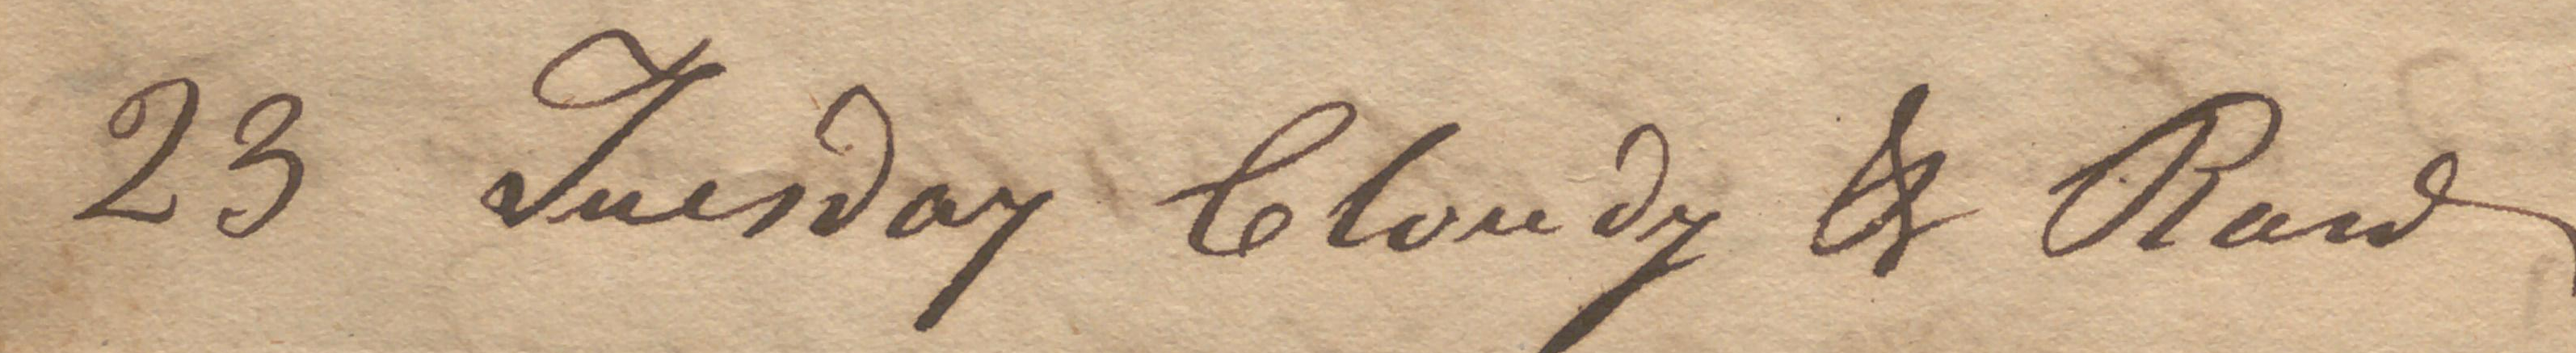23 Tuesday Cloudy & Raw
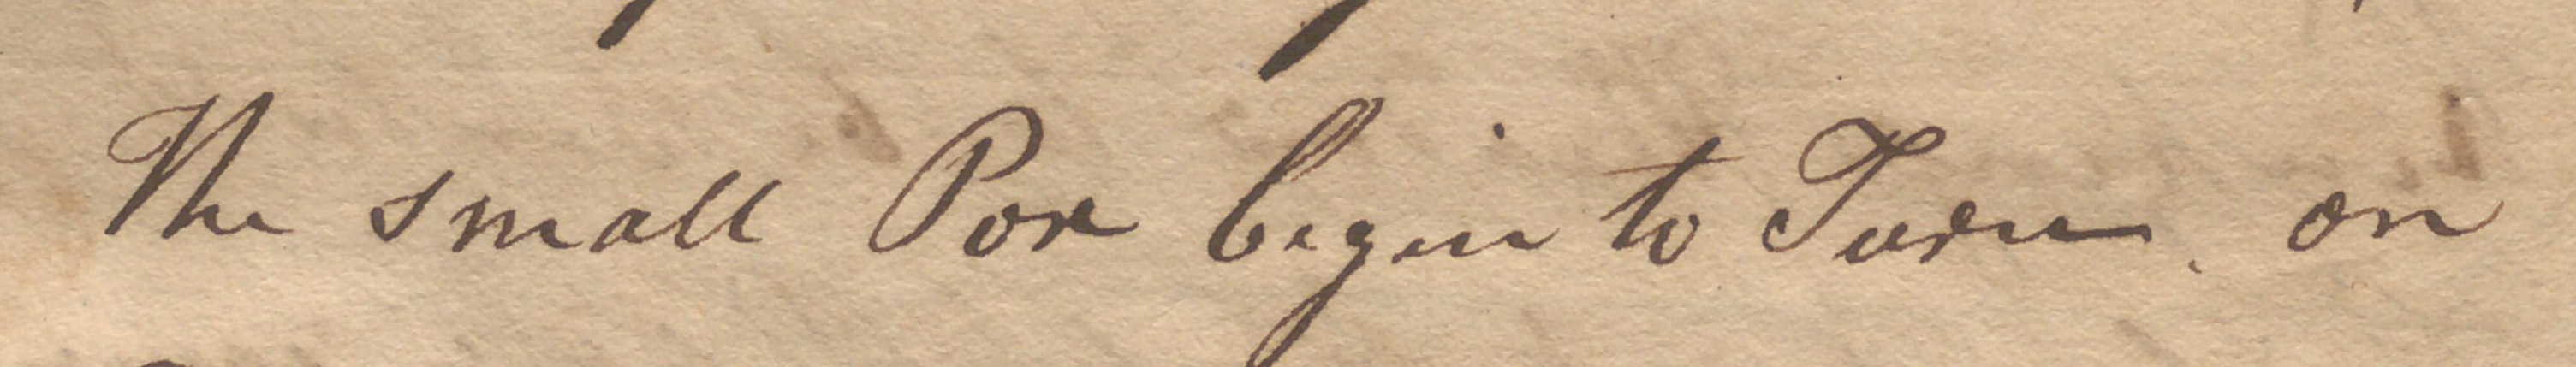The small Pox begin to Turn on
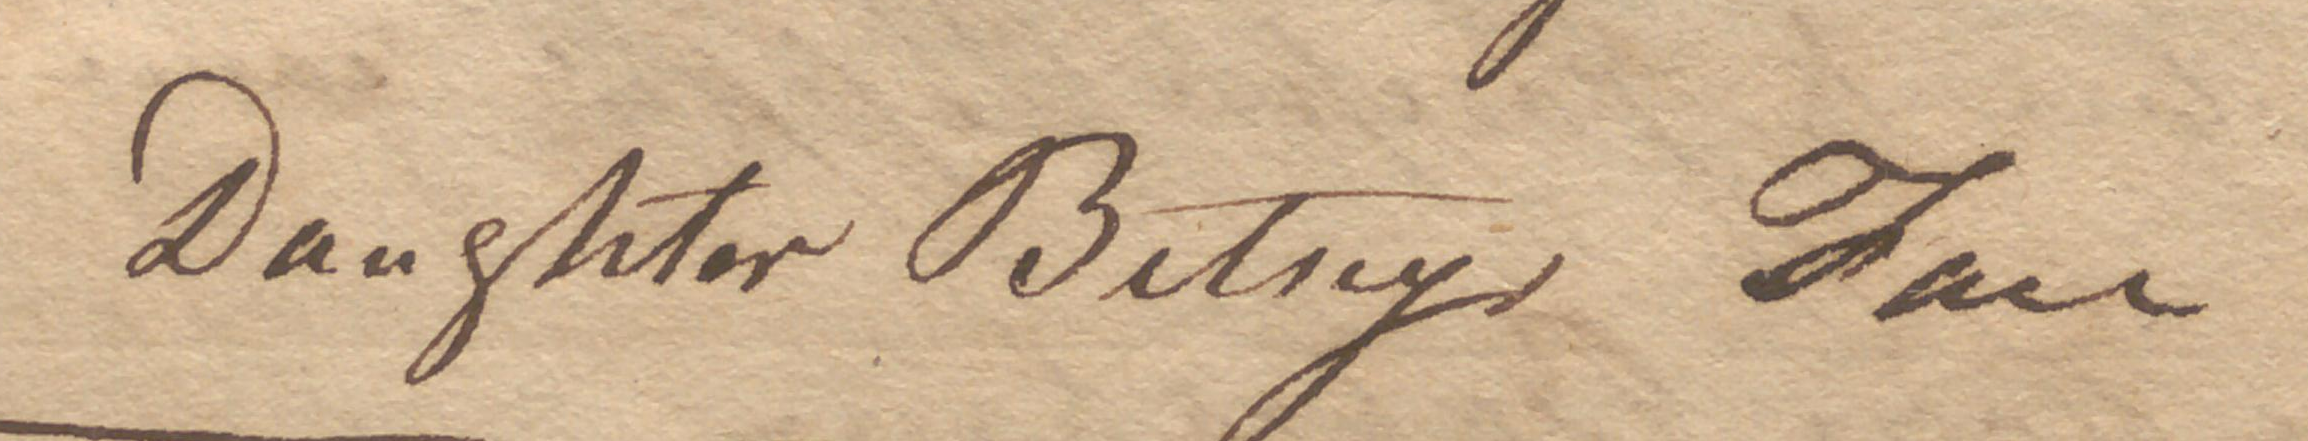Daughter Betseys Face
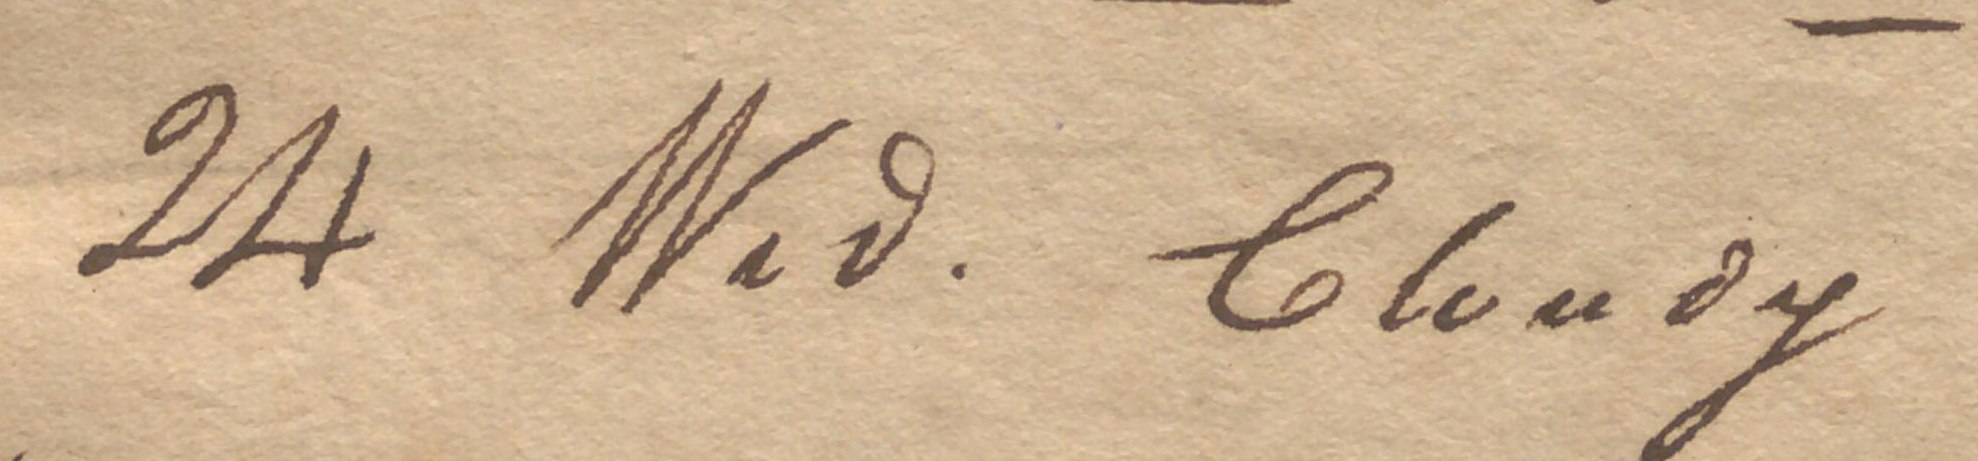24 Wed. Cloudy
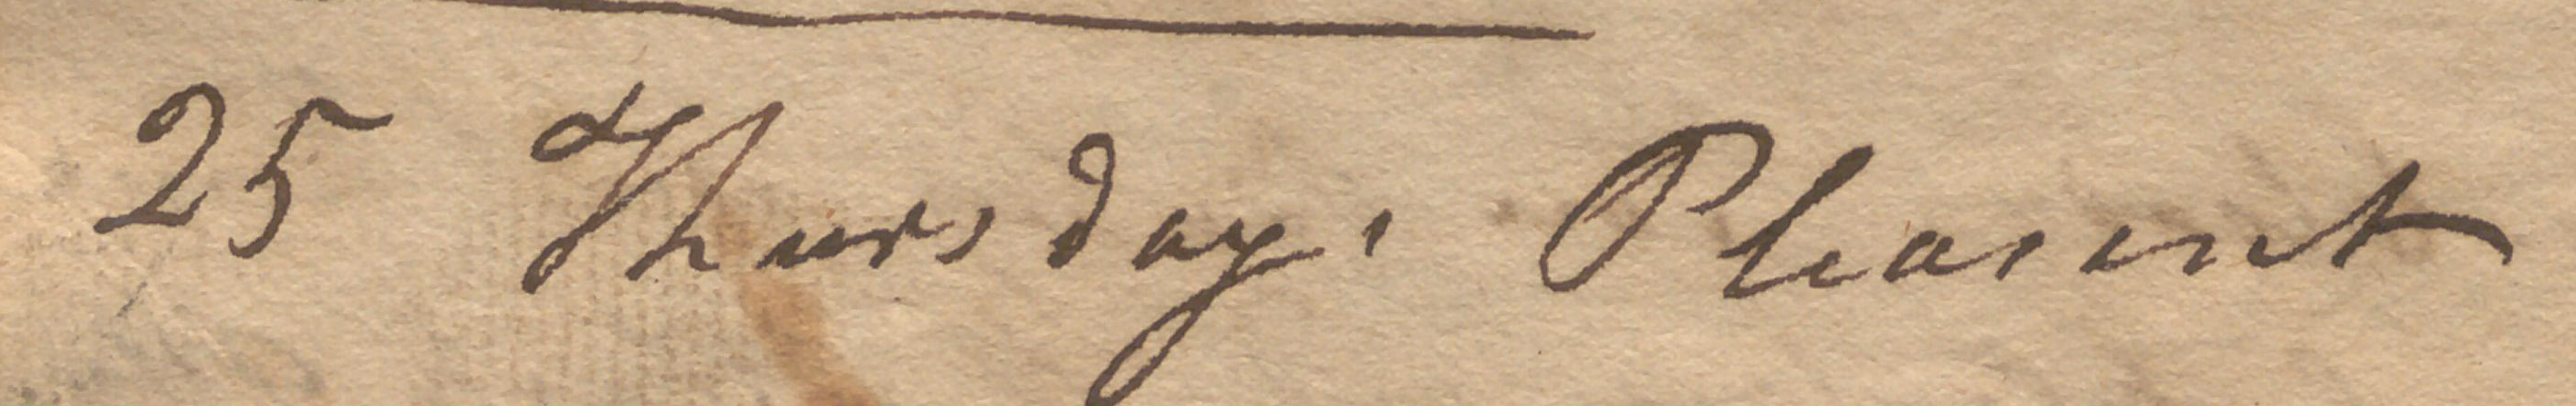25 Thursday. Pleasent
